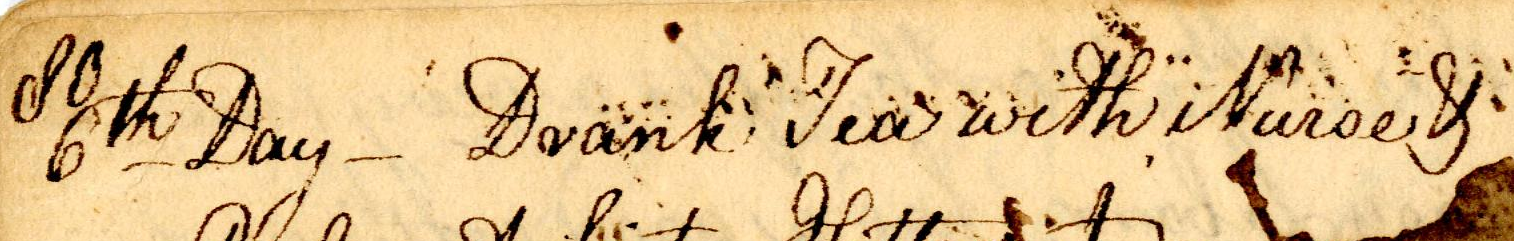6^th Day- Drank Tea with Nurse &
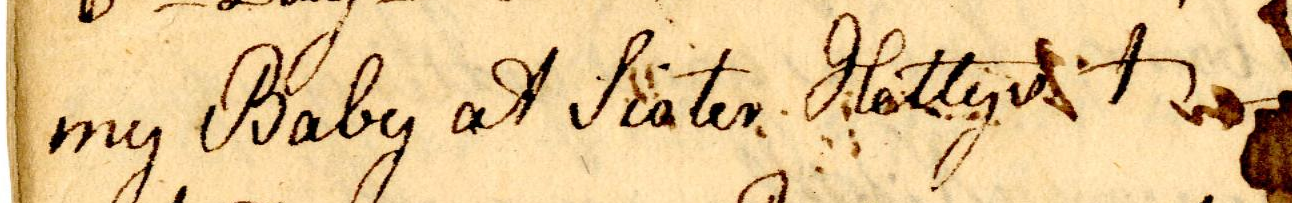my Baby at Sister Hettys
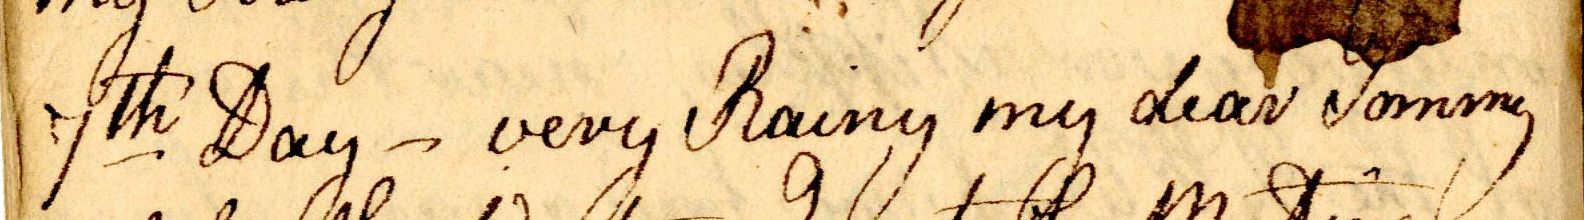7^th Day- very Rainy my dear Tommy
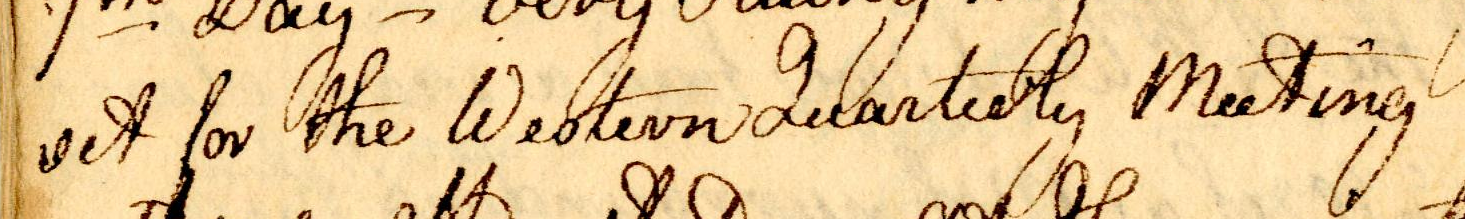set for the Western Quarterly Meeting
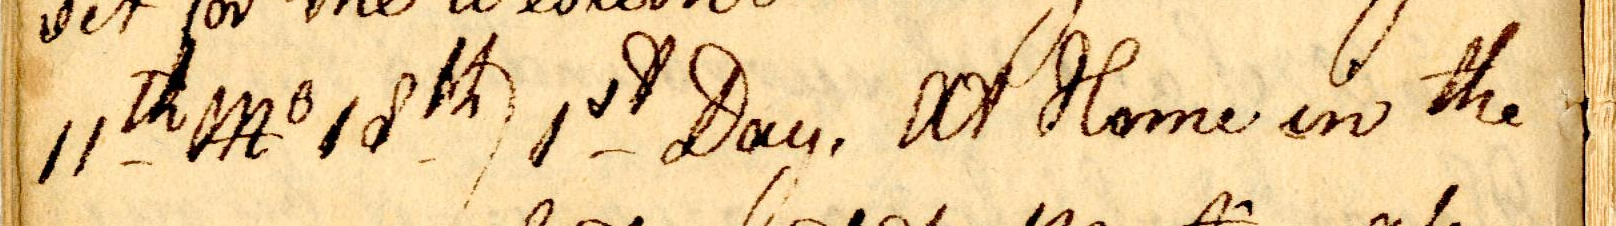11^th M^o 18^th) 1^st Day, At Home in the
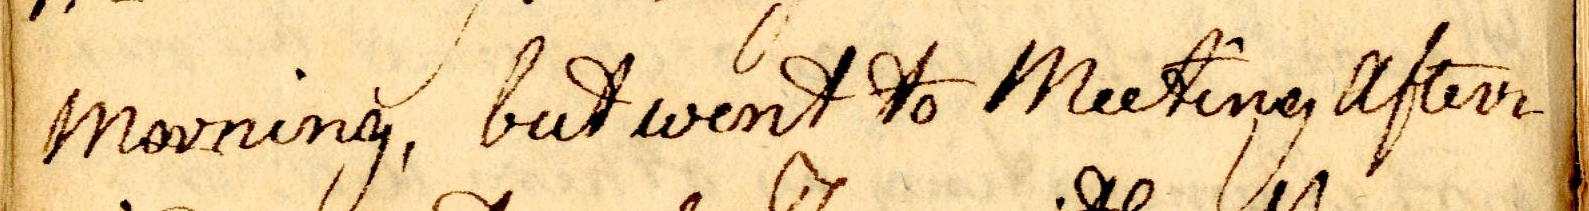Morning, but went to Meeting after
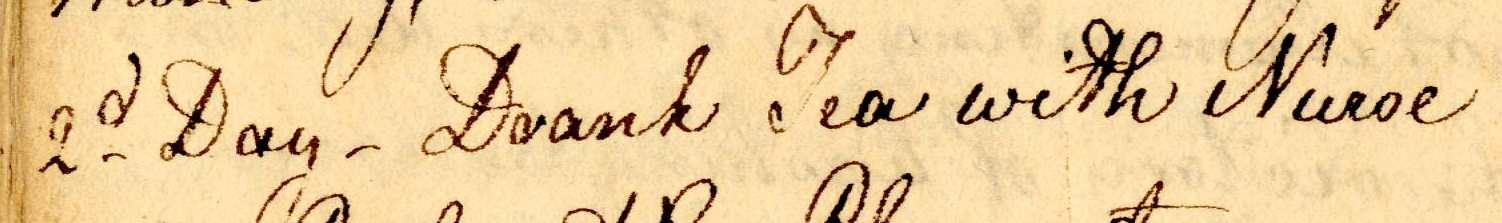2^d- Day- Drank Tea with Nurse
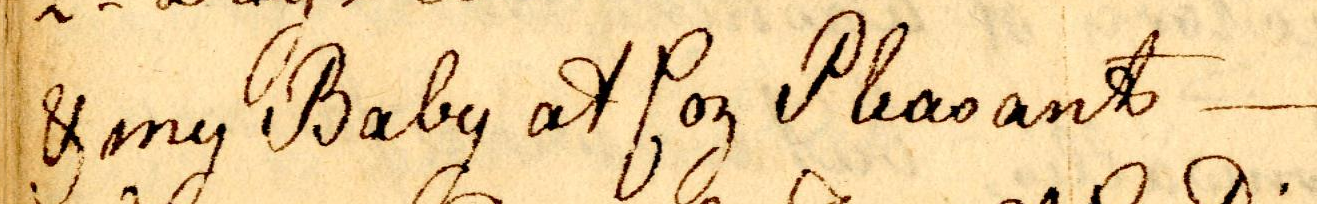& my Baby at Coz Pleasants
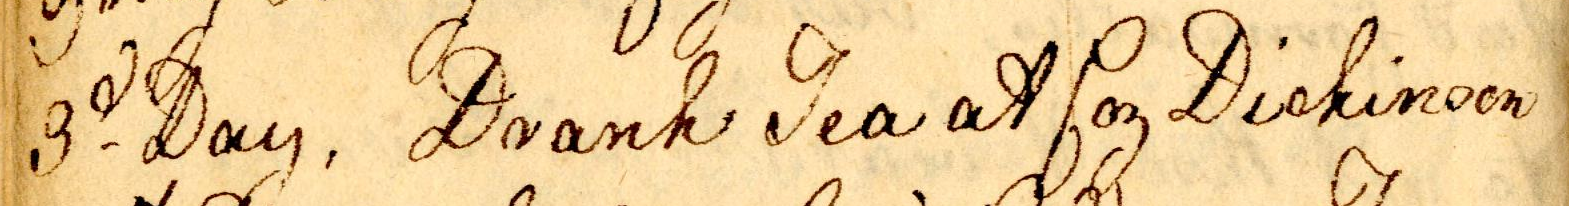3^d Day, Drank Tea at Coz Dickinson
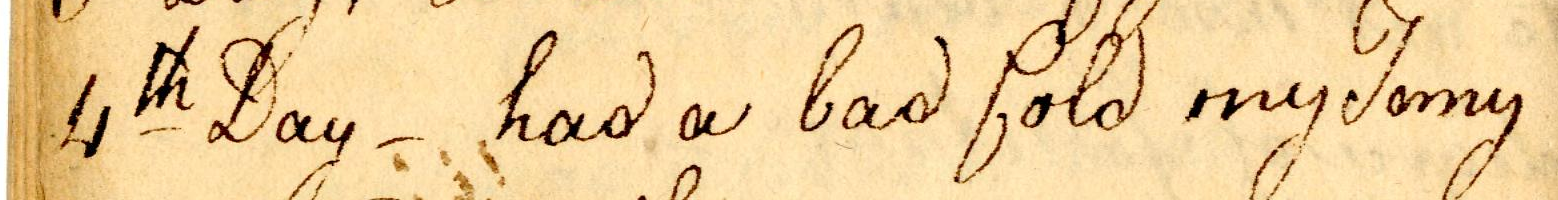4^th Day- had a bad Cold my Tomy
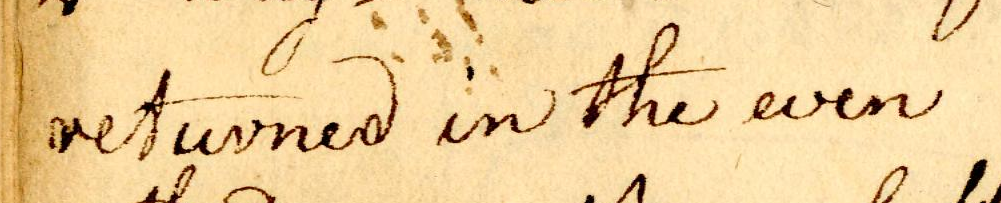returned in the even
